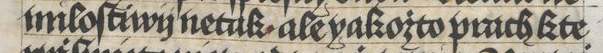miloſtiwij netak.ale yakożto prach kte¬
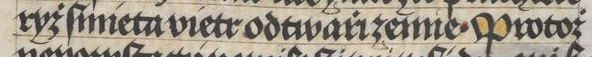ryż ſmíeta vietr odtwaṙi zemie.Protoż
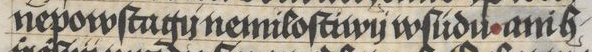nepowſtagij nemiloſtiwij wſúdu.ani h¬
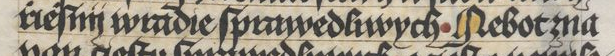řieẛnij wradie ſprawedliwych.Nebot zna
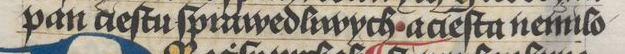pan cieſtu ſprawedliwych.a cieſta nemilo¬
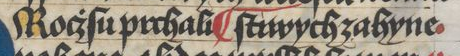Rocżſu prchali stiwych zahyne.
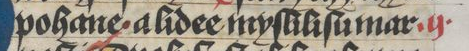pohane.a lidee myſlili ſu mar.ii.
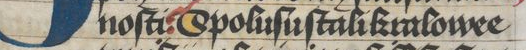nosti?Zpoluſu ſtali kralowee
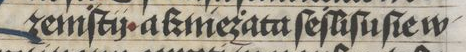zemẛtij.a knieżata ſeẛli ſu ſie w
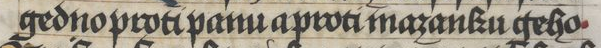gedno proti panu a proti mazanku geho.
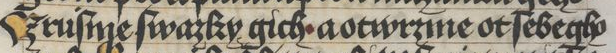Zruẛme ſwazky gich.a otwrzme ot ſebe gho
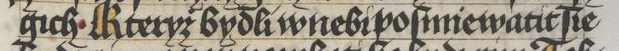gich.Kteryż bydlí w nebi poſmiewatit ſie
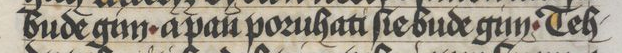bude gim.a pan poruhati ſie bude gim.Teh¬
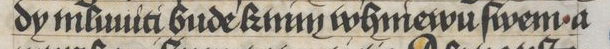dy mluviti bude knim whniewu ſwem.a
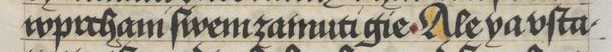wprchani ſwem zarmuti gie.Ale ya vſta¬
